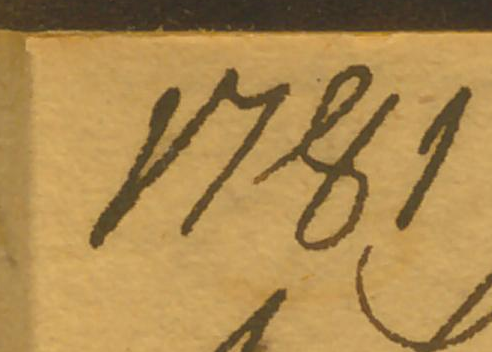1781
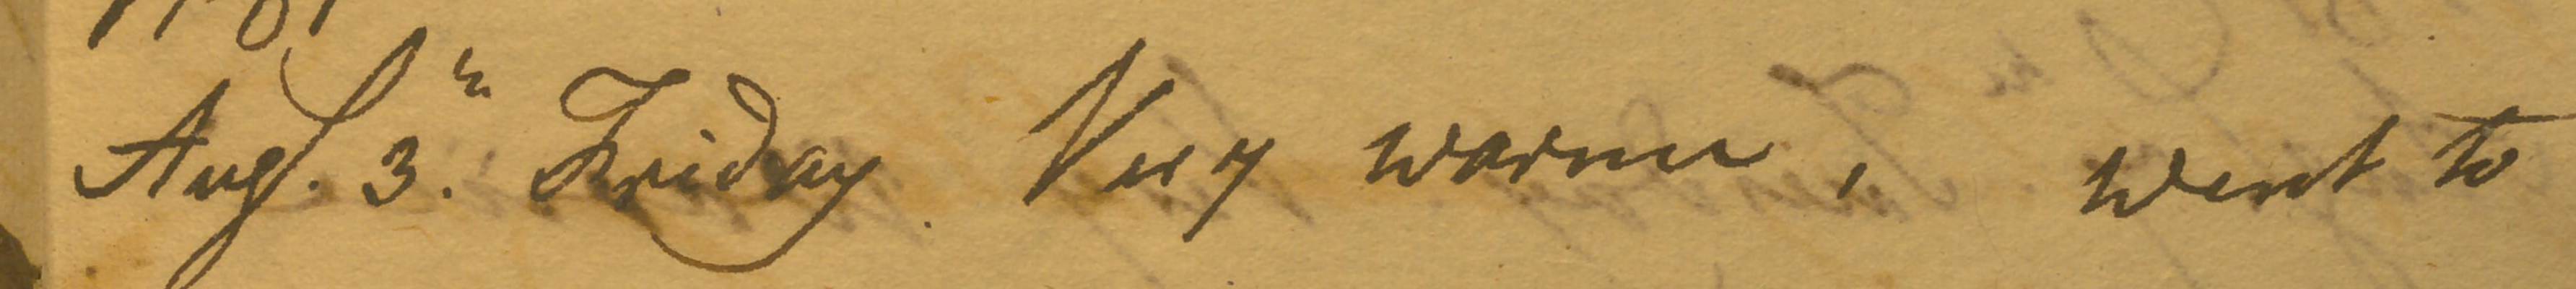Aug^t. 3^th. Friday. Very warme, went to
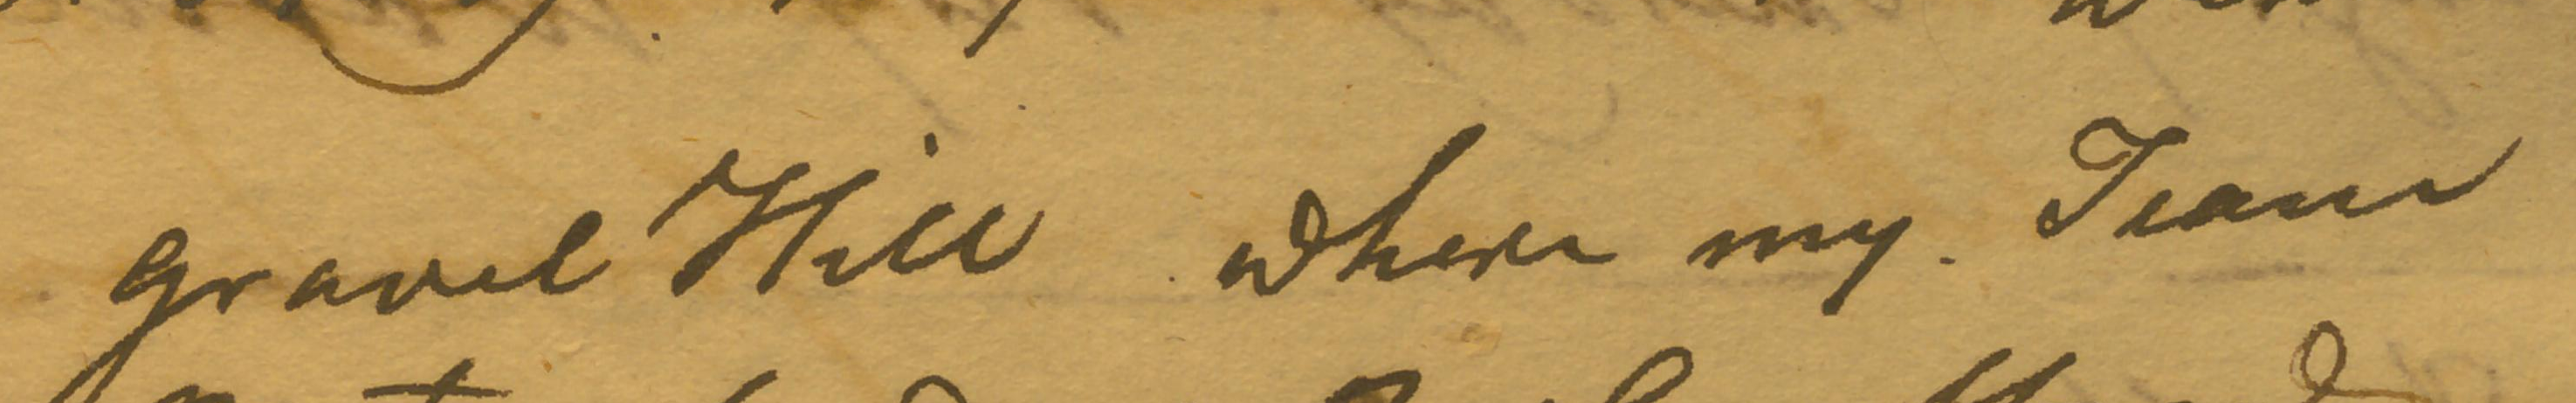gravel Hill, where my Team
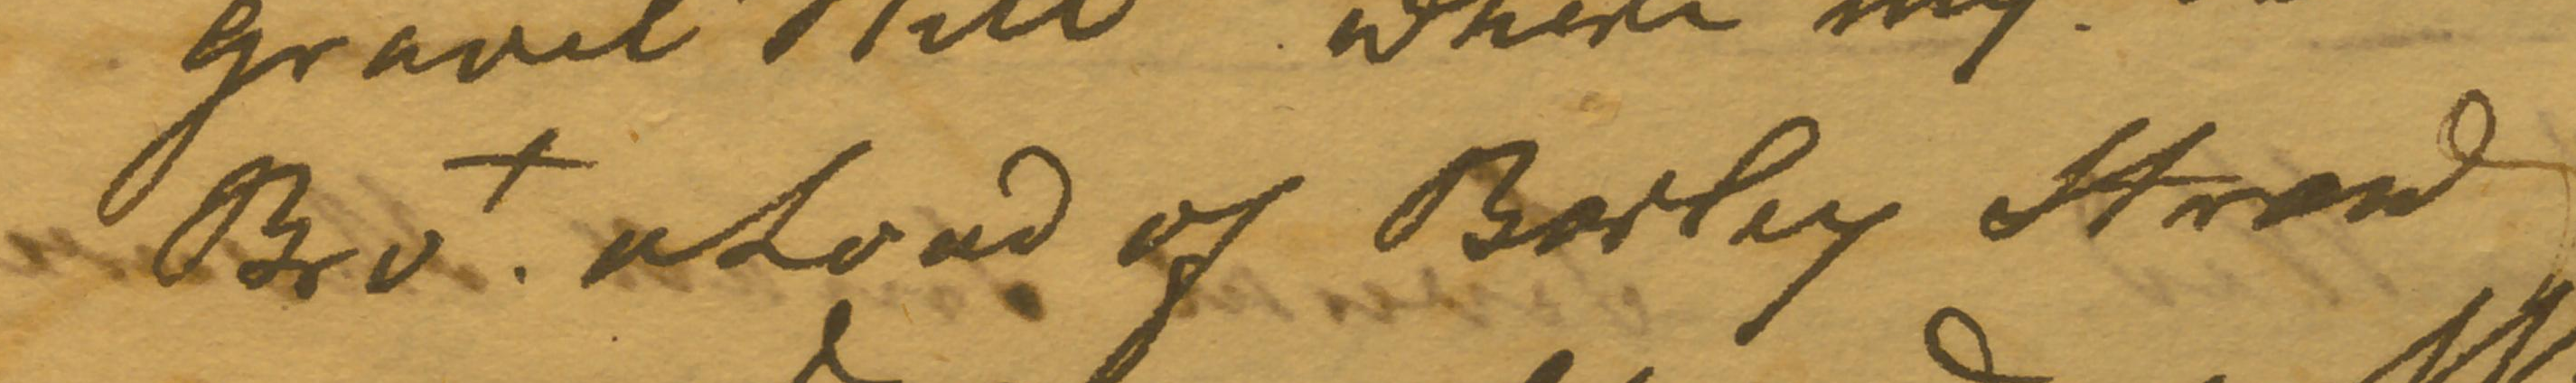Bro^t a Load of Barley Strand
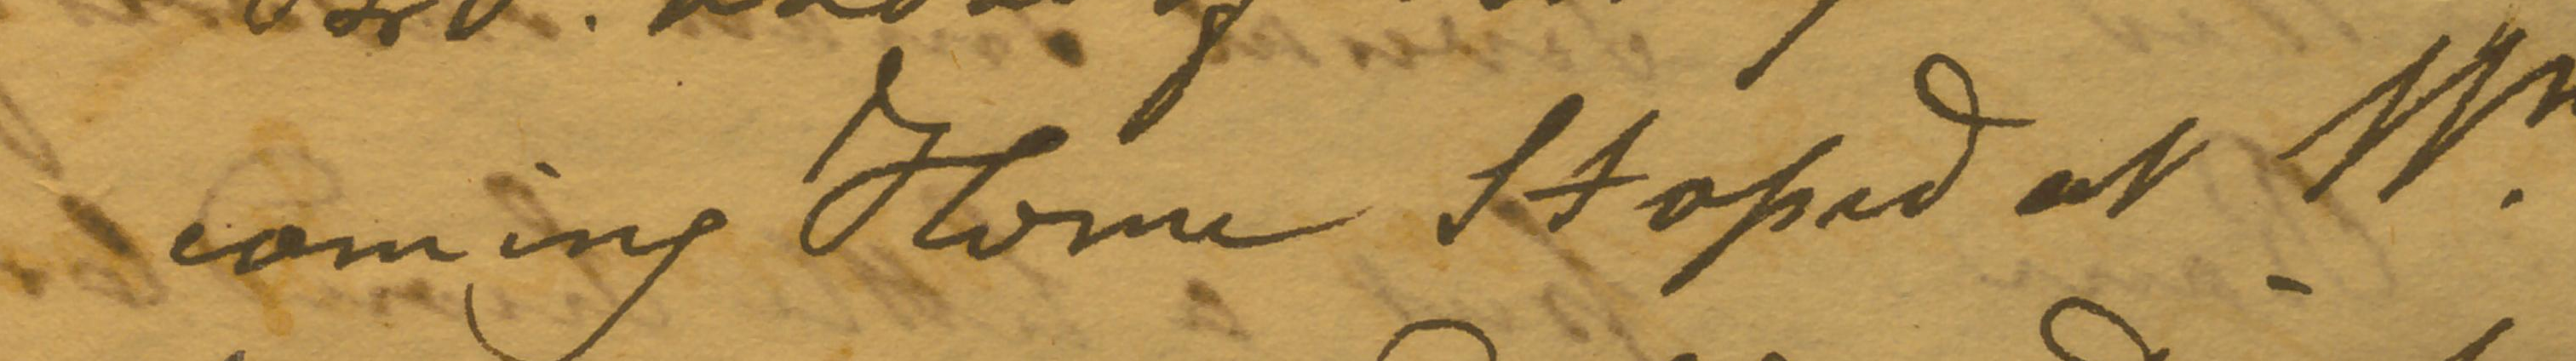coming Home Stoped at W^m.
